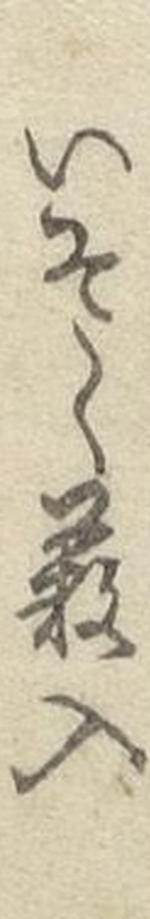いそく藪入
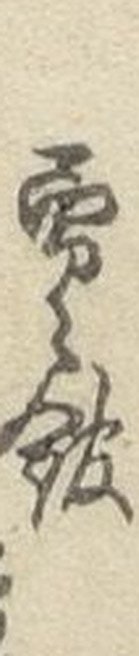勇々館
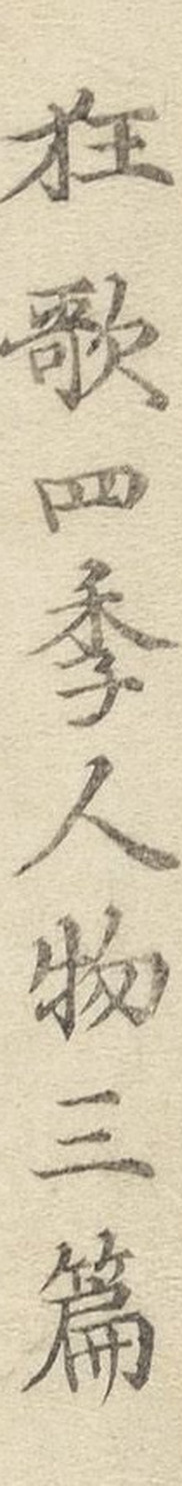狂歌四季人物三篇
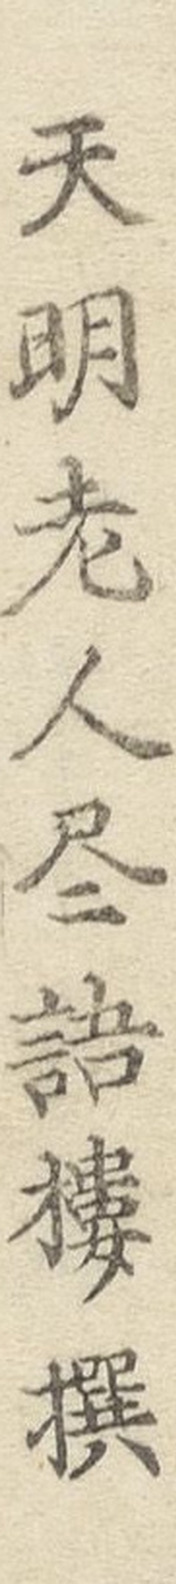天明老人尽語楼撰
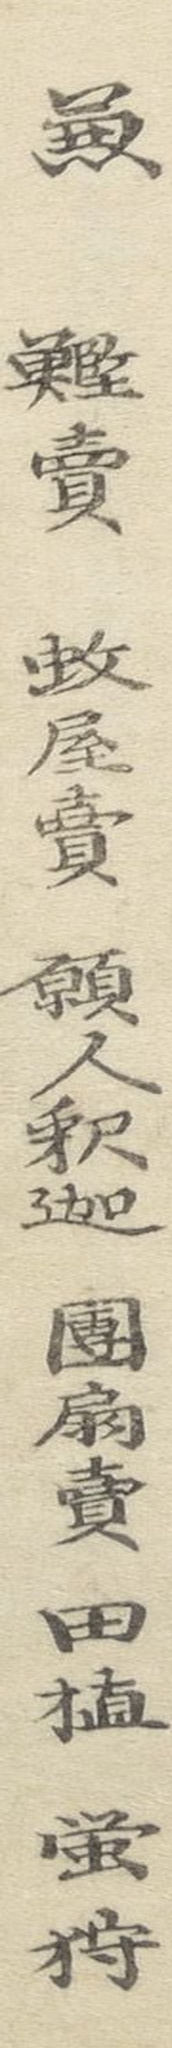兼鰹売蚊屋売願人釈迦団扇売田植
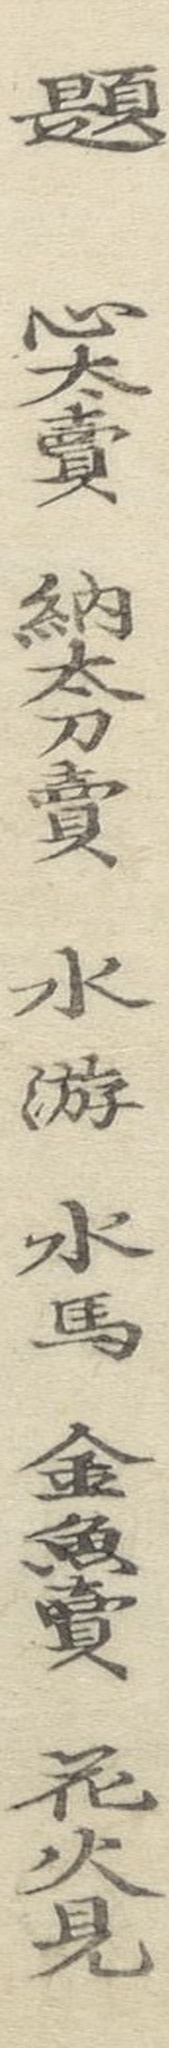題心太売納太刀売水游水馬金魚売
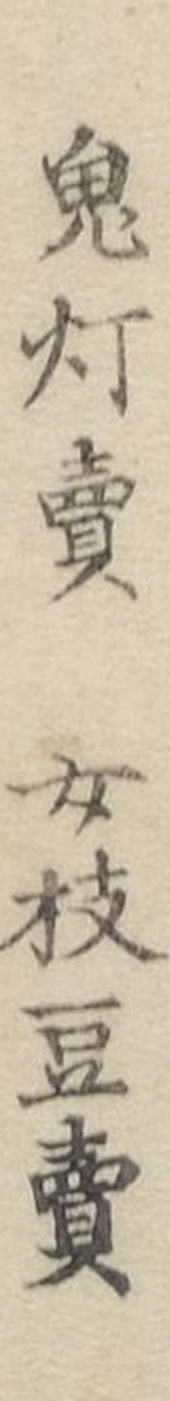鬼灯売女枝豆売

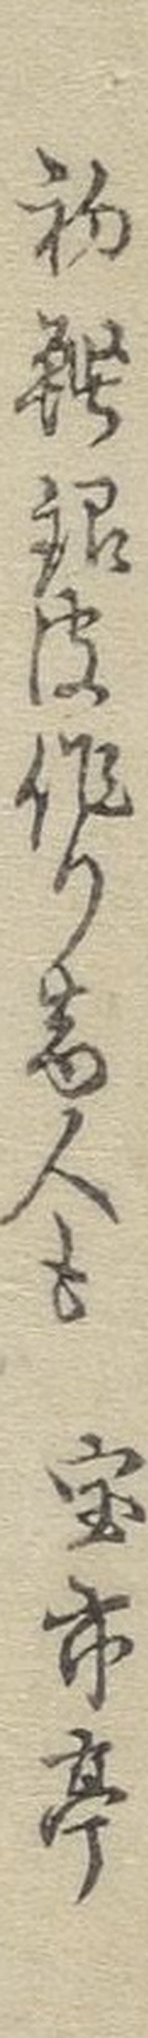初鰹銀皮作り商人も宝市亭
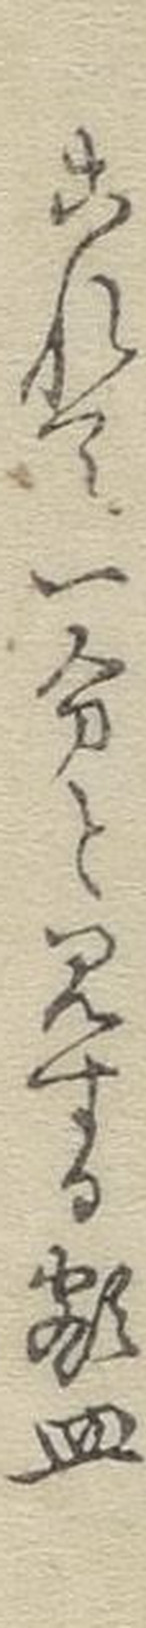これて一分と見する額皿
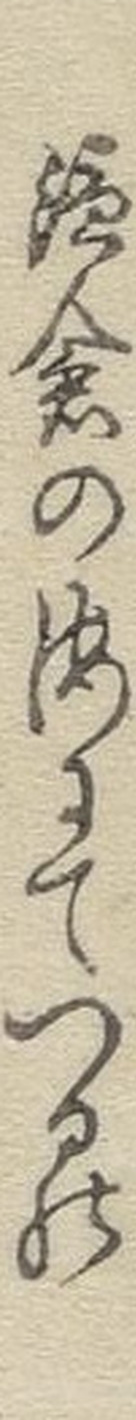鎌倉の海にてつるの
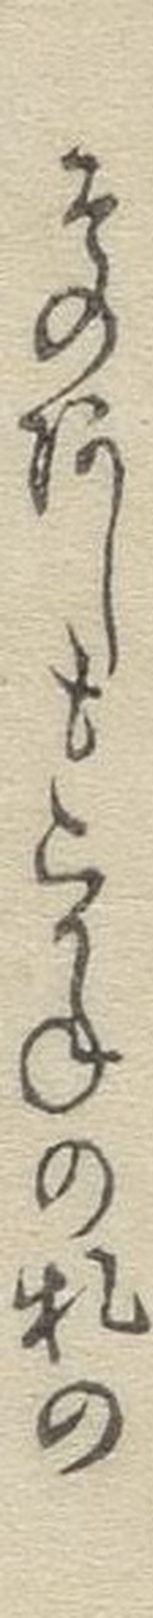そのあしもこかねの札の
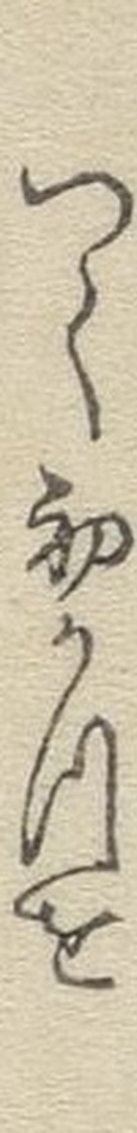つく初かつを
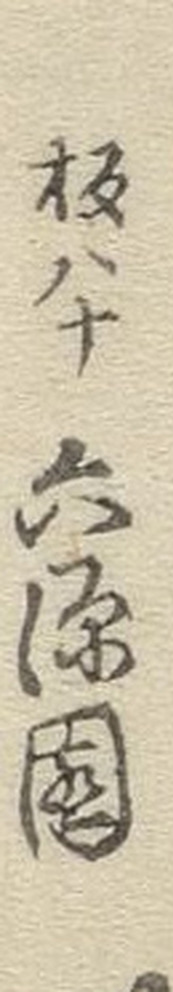板ハナ六源園
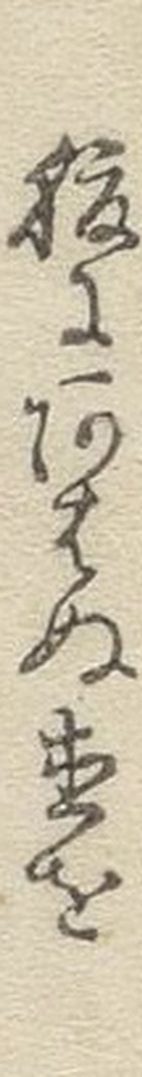腹にあはぬ直を
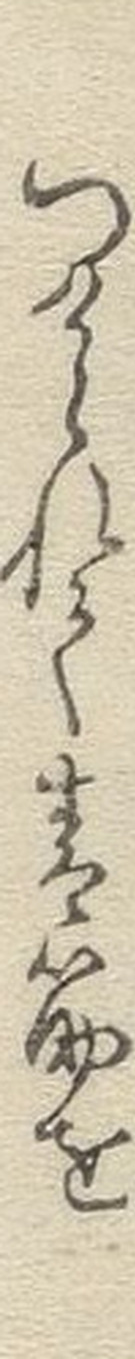つけられて青筋を
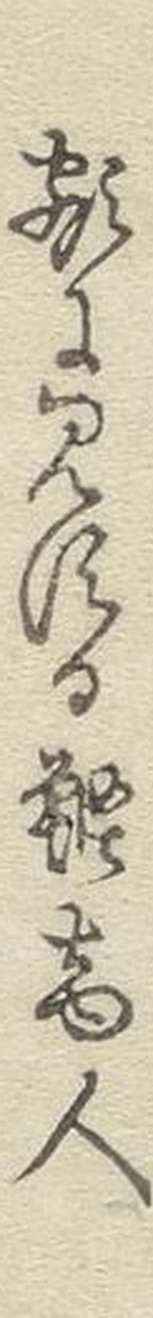額に見する鰹商人
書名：Picture Album of People with Kyōka (Light Verse) (Kyōka shiki jinbutsu 狂歌四季人物)
